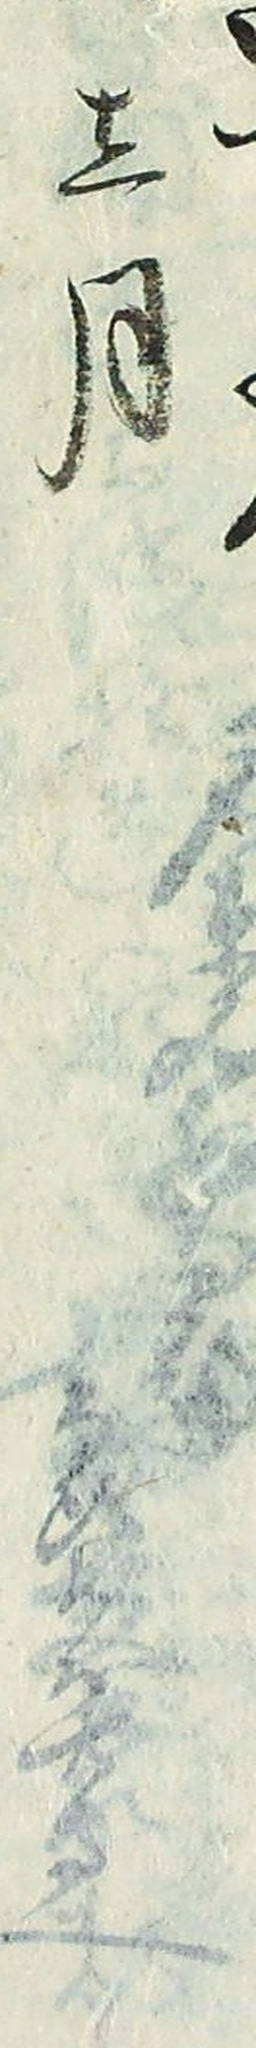十二月
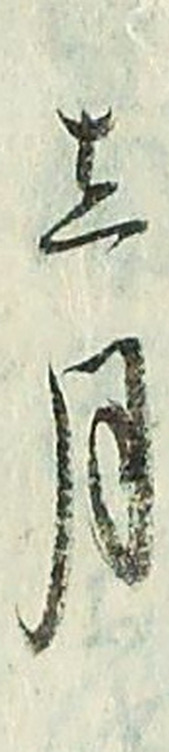十二月
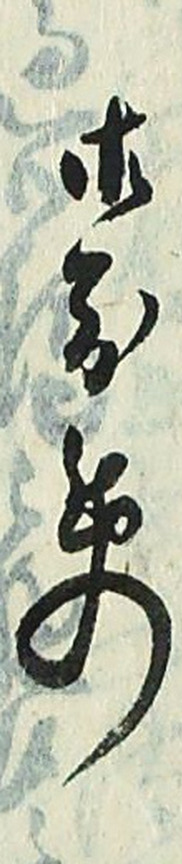御別帋
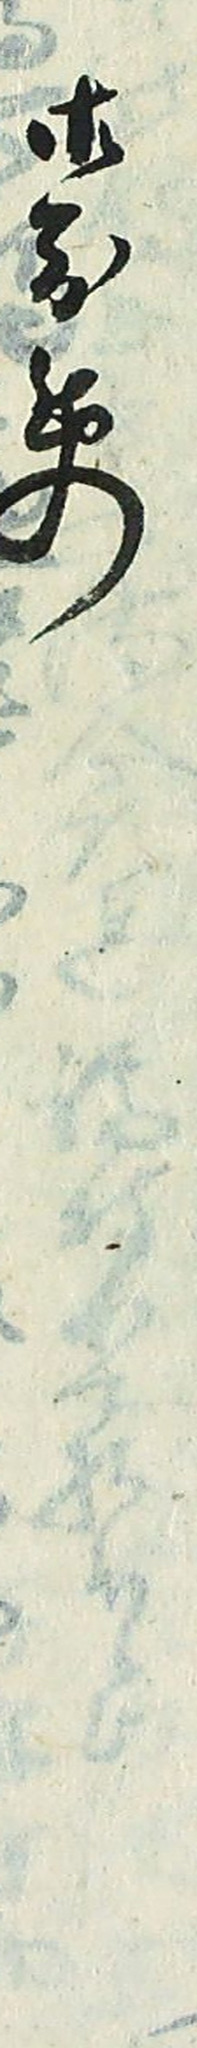御別帋
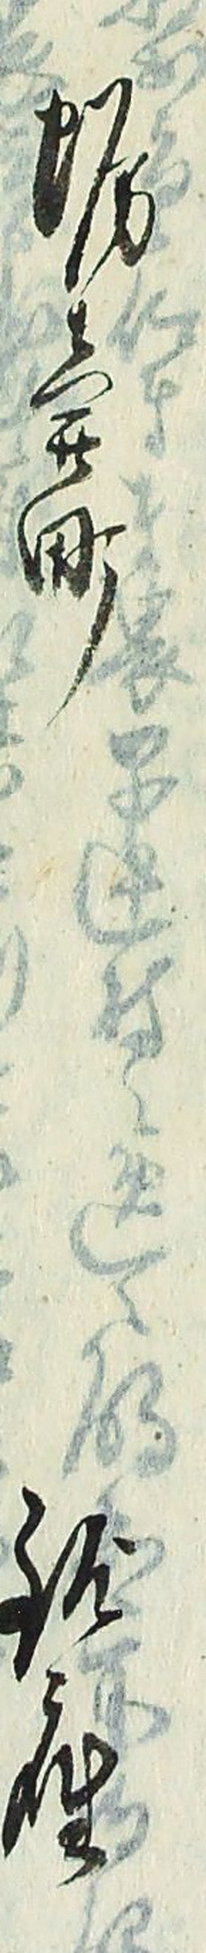蠣殻町銀座
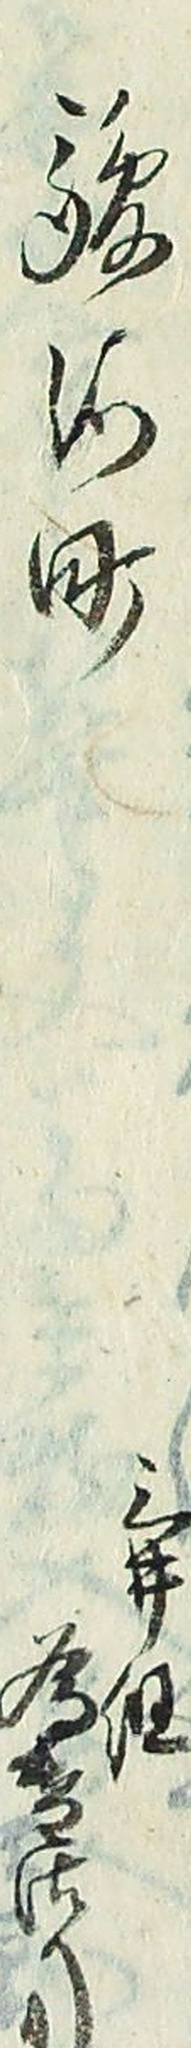駿河町三井組
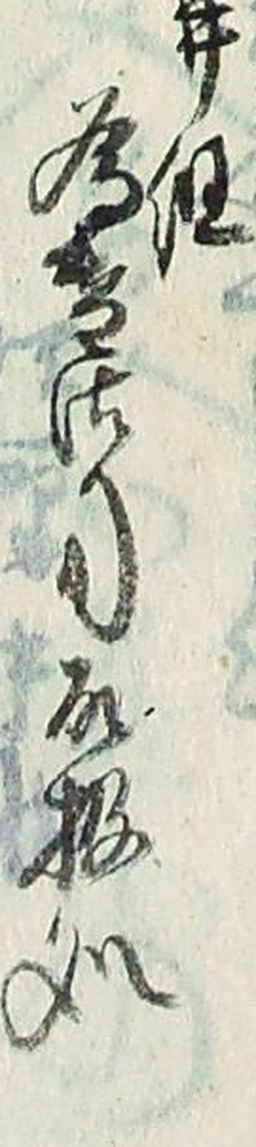為替御用取扱処
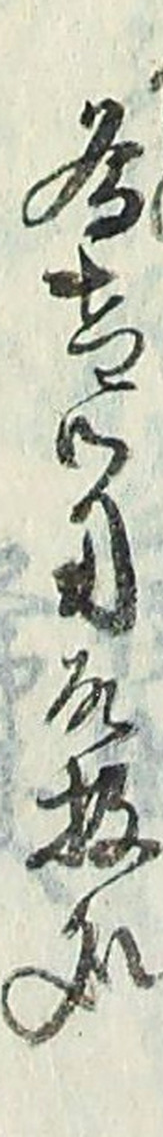為替御用取扱処
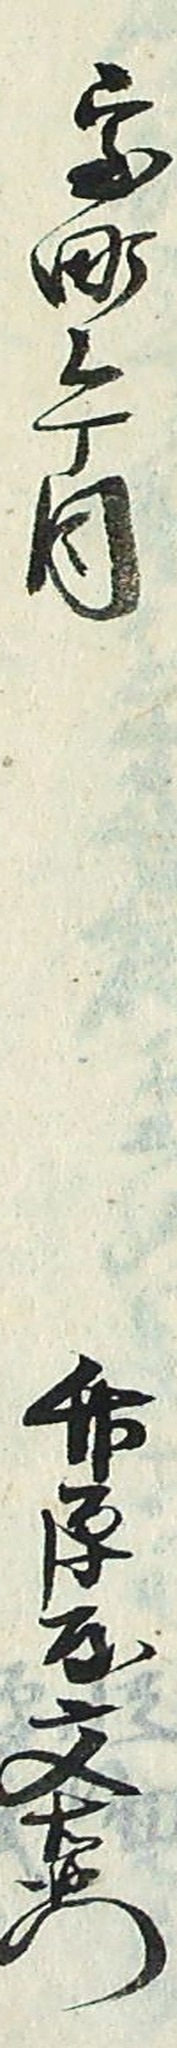室町三丁目竹原屋文右衛門
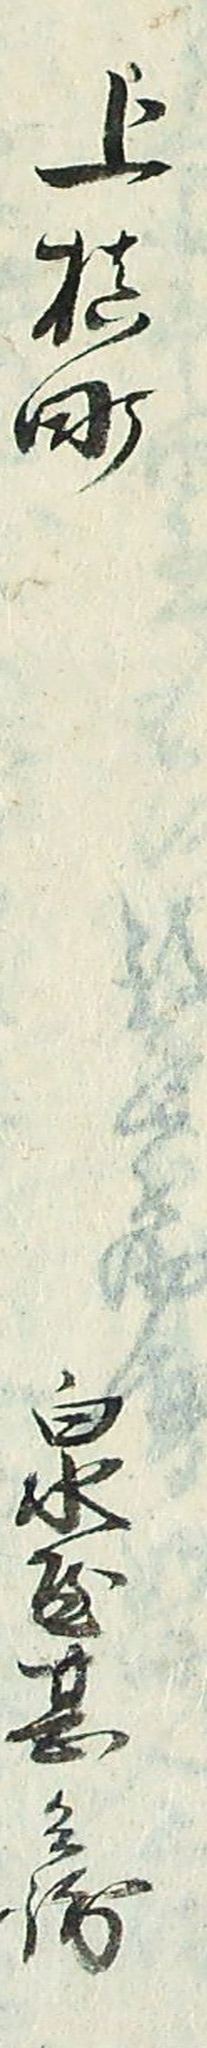上槙町泉屋甚兵衛
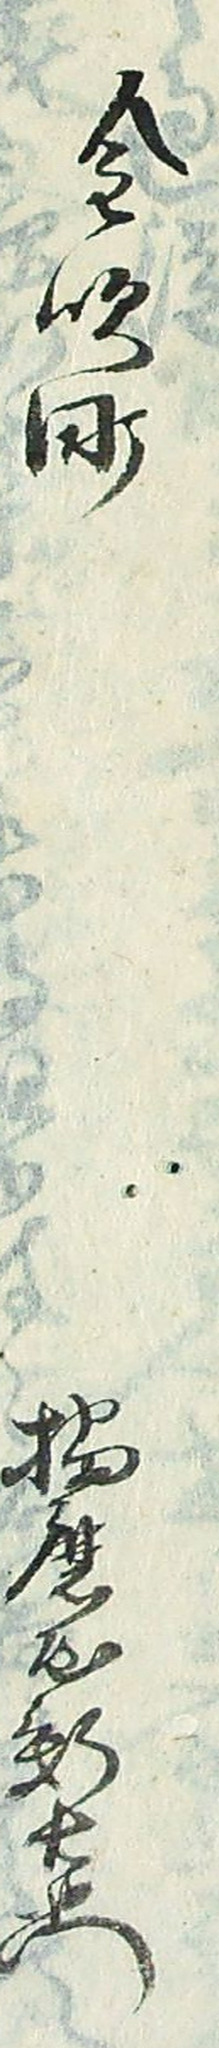金吹町播磨屋新右衛門
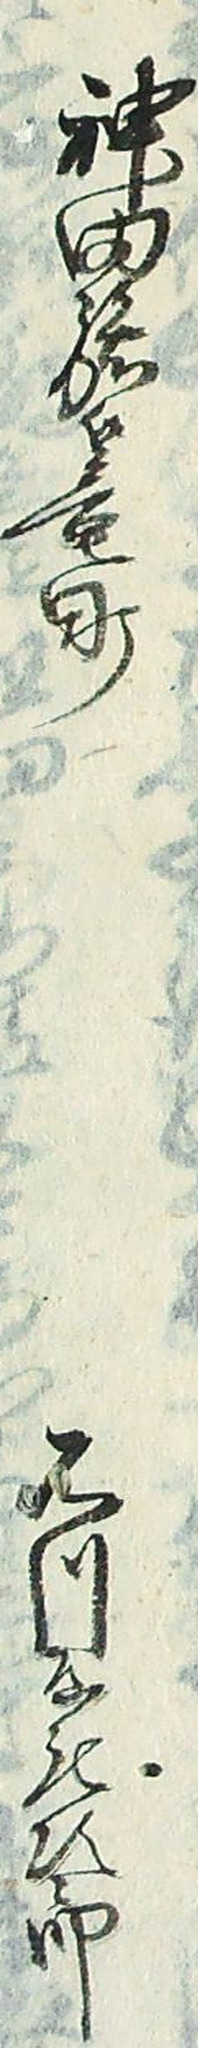神田旅篭町石川屋庄次郎

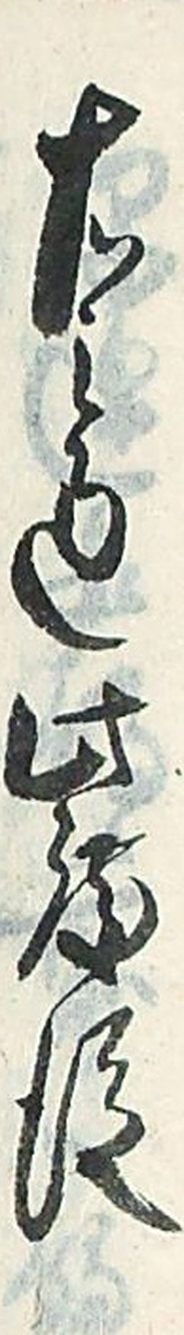右之通此度従
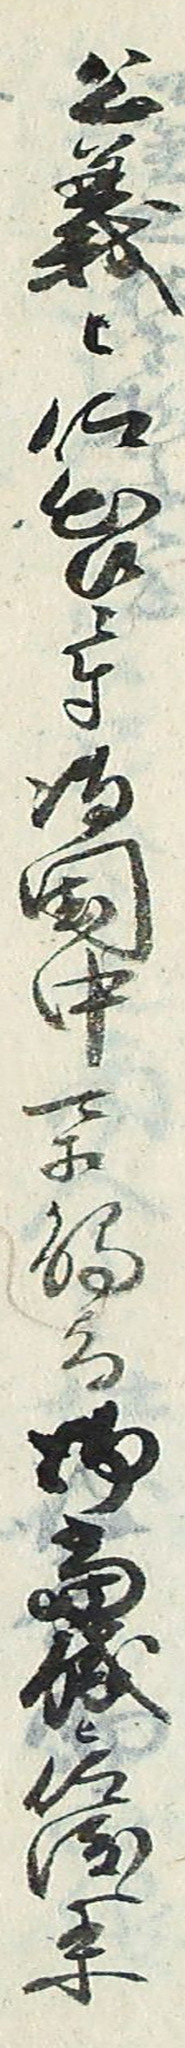公義被仰出候に付御国中可相触旨御当職被仰渡候条
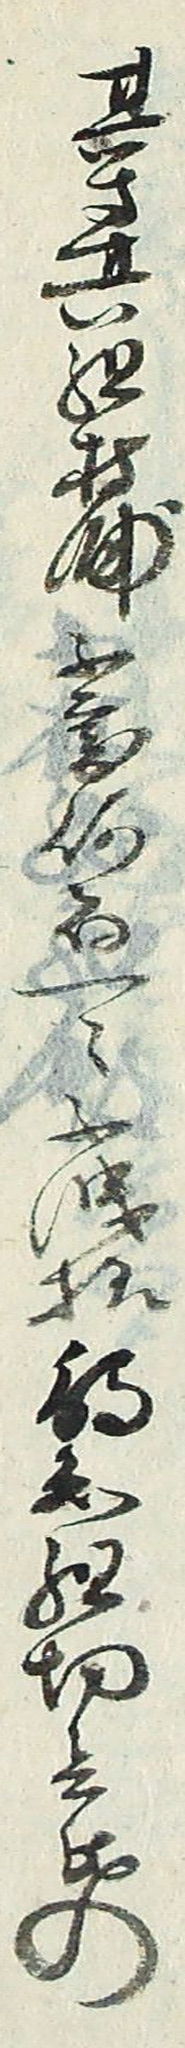其方共組村浦不寄何者一々不洩様触知組切壱帋
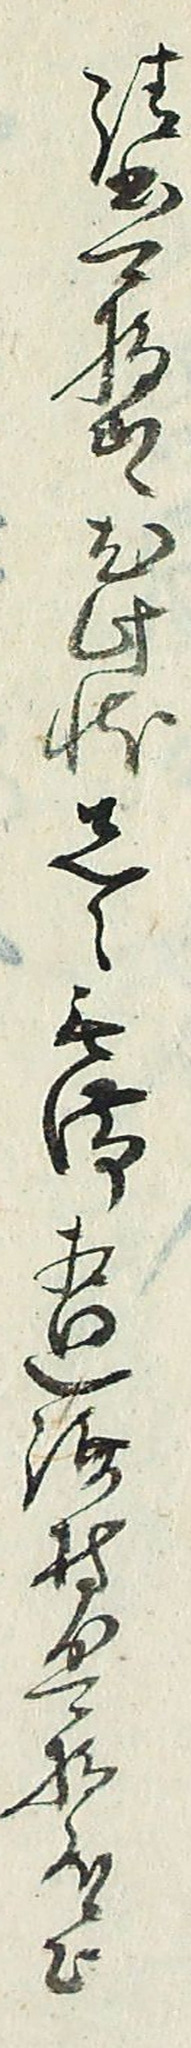請書可指出候尤此状先々無滞相廻済村ゟ可指戻候以上
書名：諸御用御□受書控
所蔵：鳴門教育大学 Naruto University of Education
